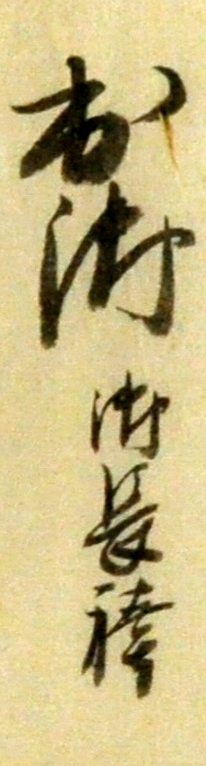出御御長袴

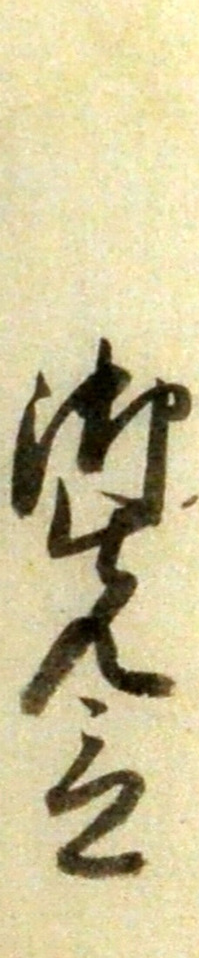御先立
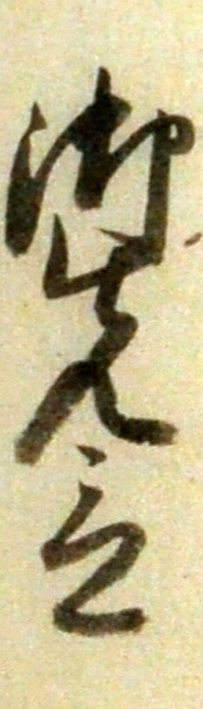御先立
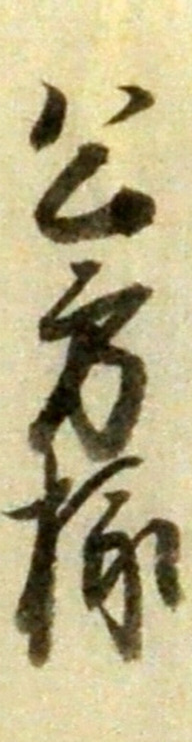公方様
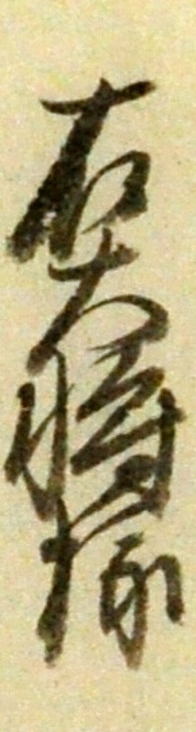右大将様
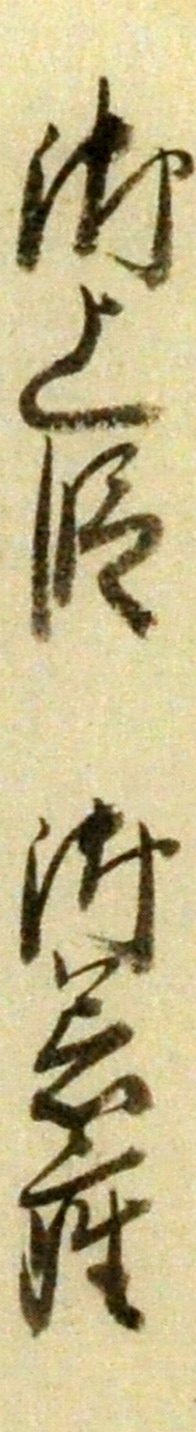御上段御着座
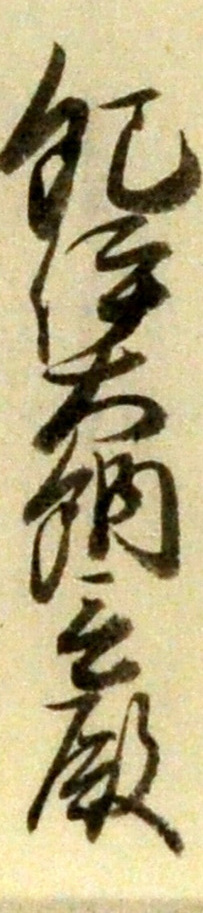紀伊大納言殿
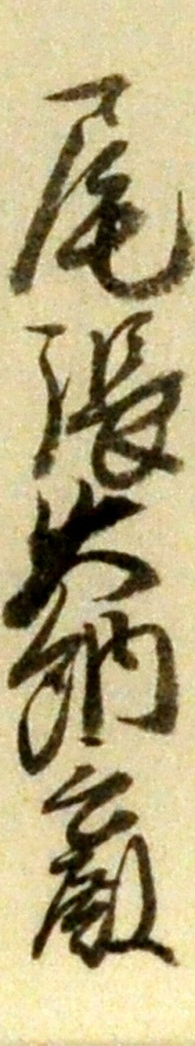尾張大納言殿
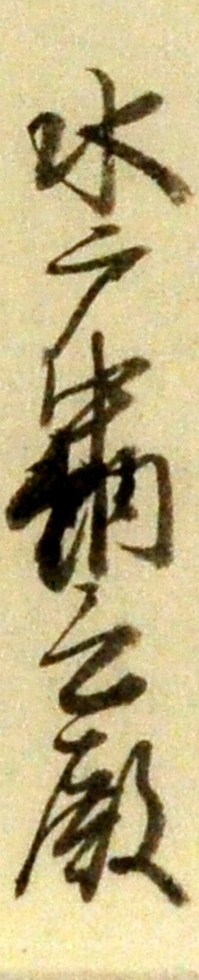水戸中納言殿
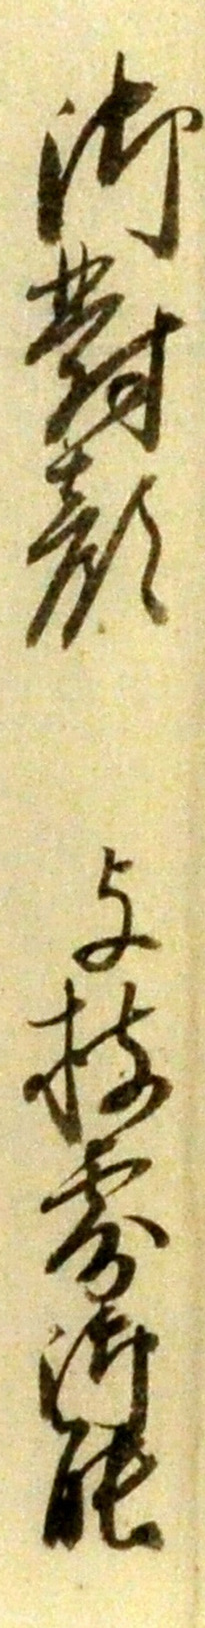御対顔与披露御能
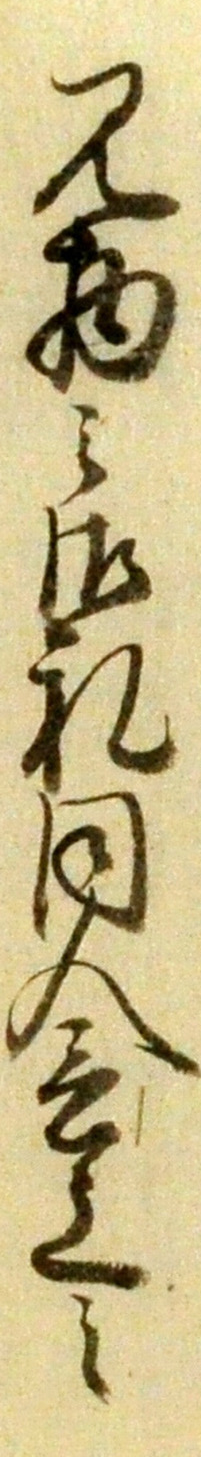見物之御礼同人言上之
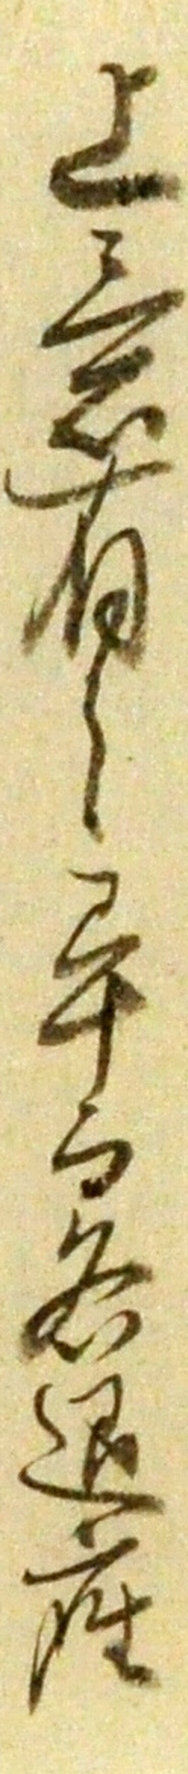上意有之畢而各退座
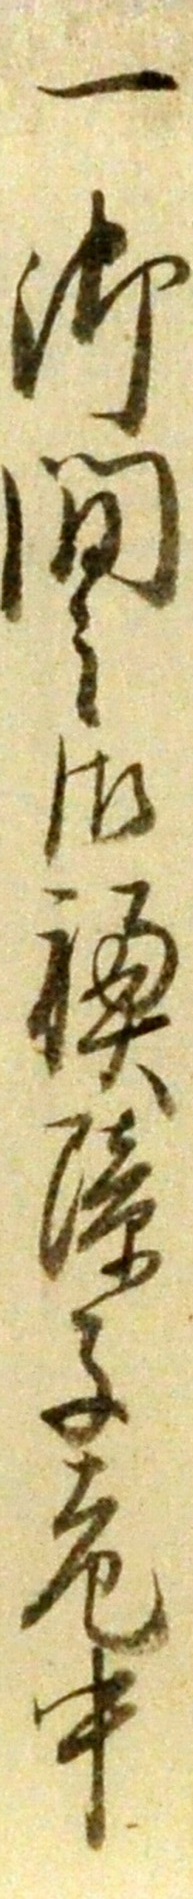一御間之御襖障子老中
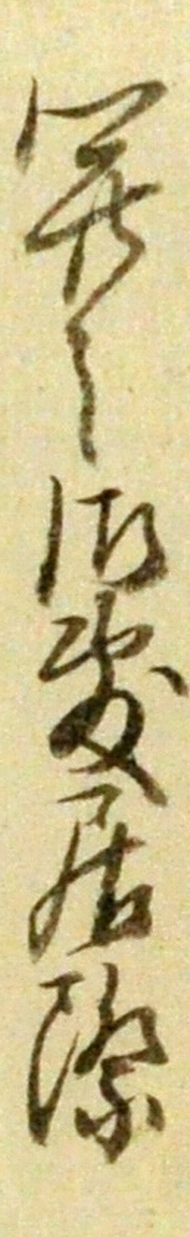開之御敷居際

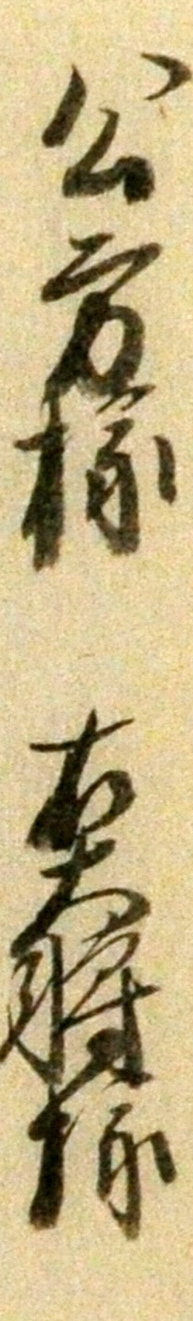公方様右大将様
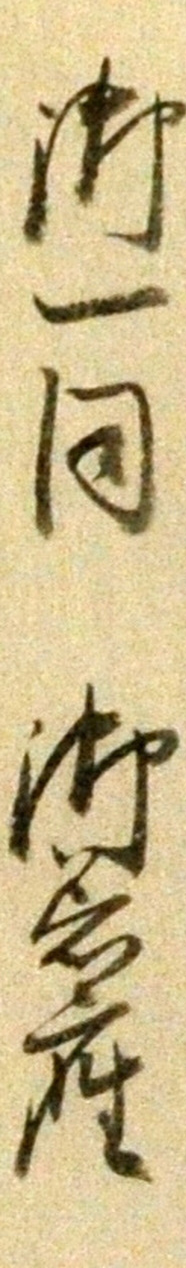御一同御着座
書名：御馳走御能ノ節ノ留外
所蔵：伊那市立高遠町図書館・合同会社AMANE
